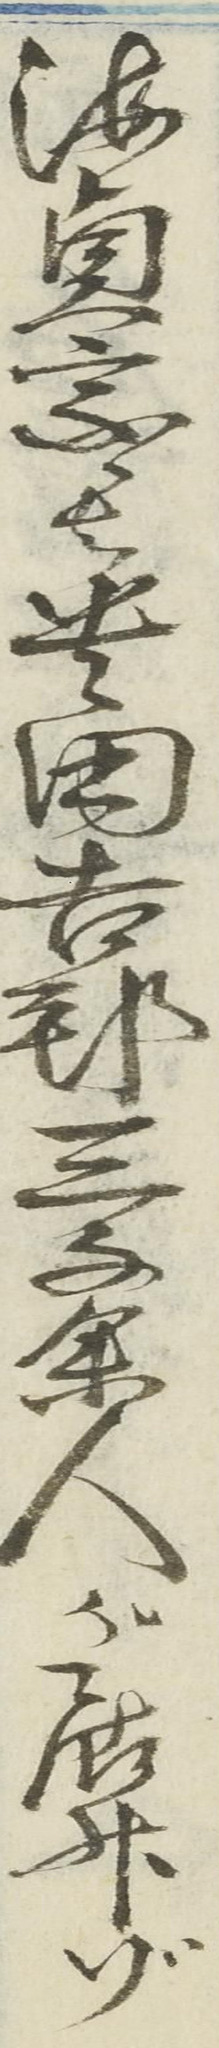海貞家二は貴田吉邨三千餘人ガ居升ゾ
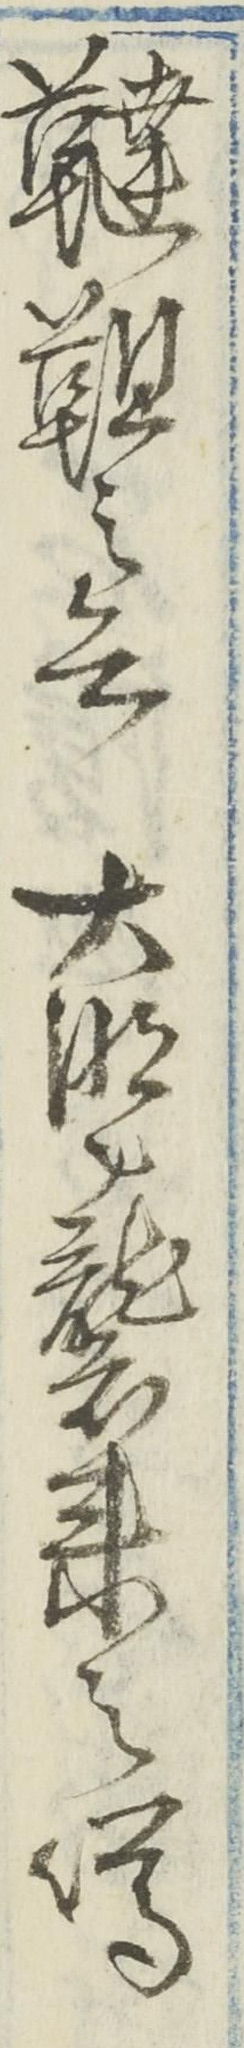韃靼之兵大明ヲ襲来之噂
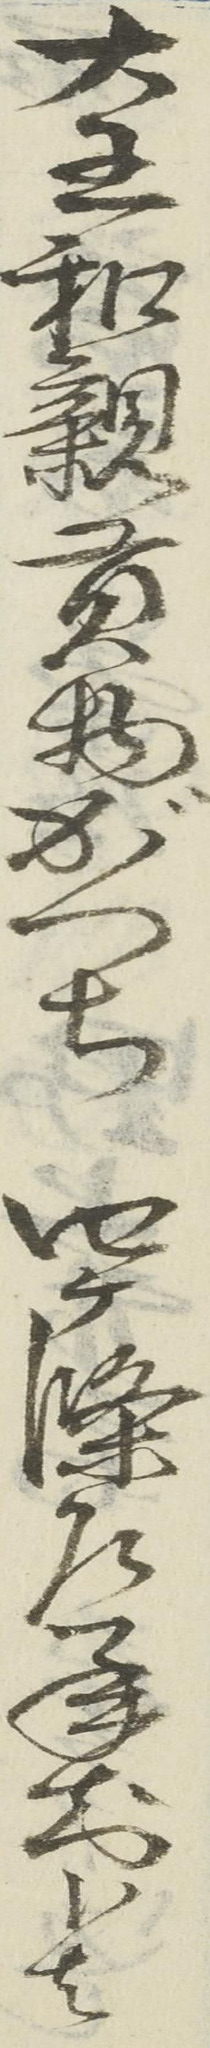大王和親貢物がつち四ヶ條乍承知トは
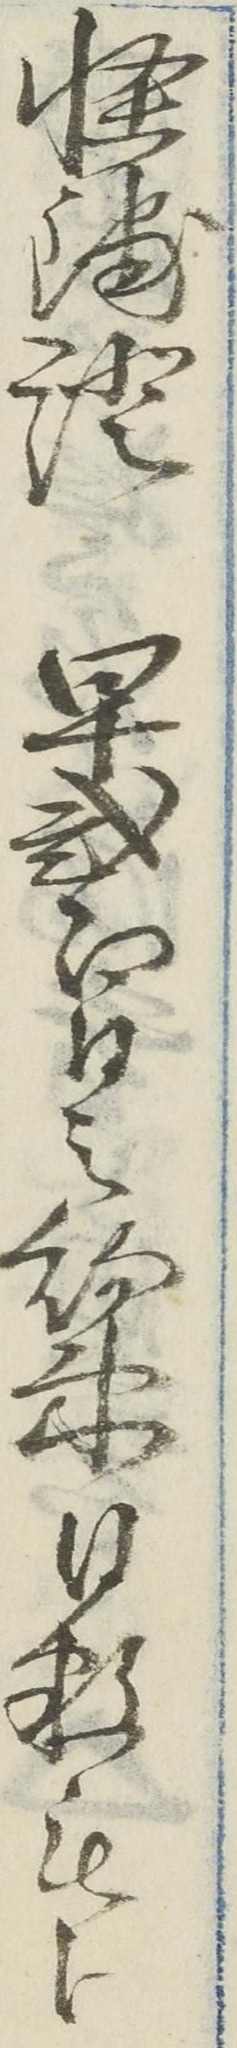怪鋪證早弐百日之約束日数もト
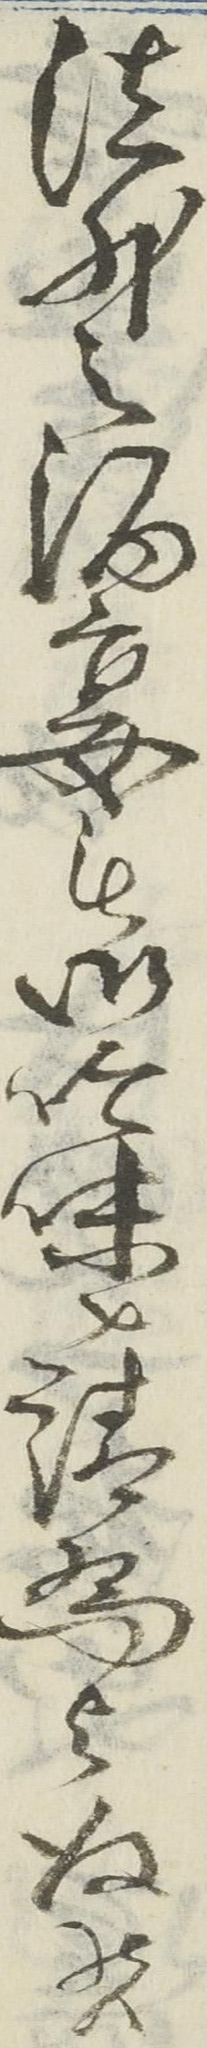法外之酒宴も御吟味ヲ請為与存候
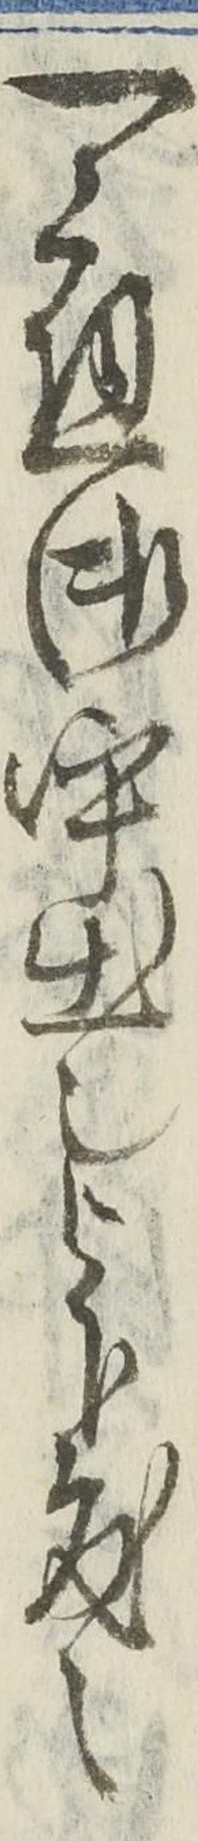一応御呼出シ被下度之
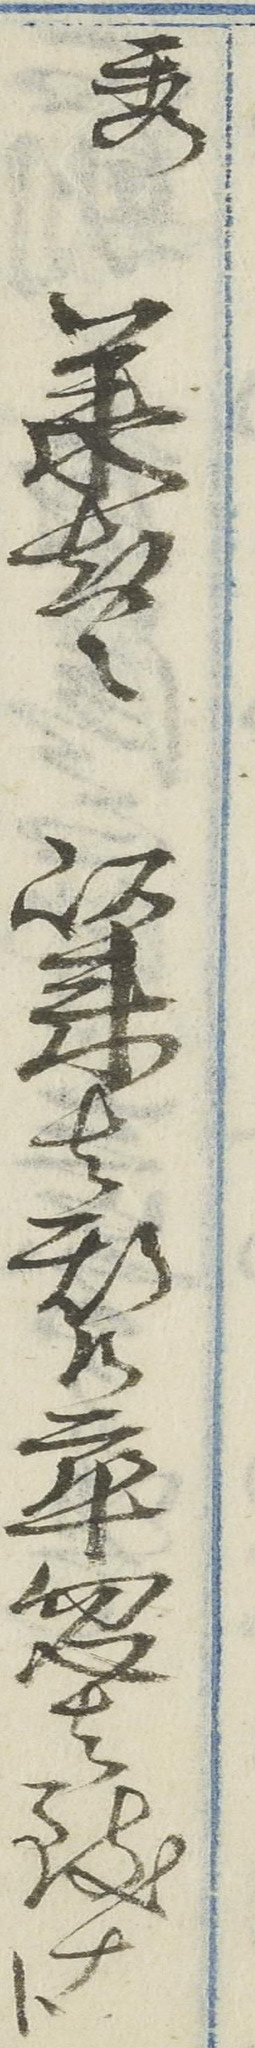秀承知之以来は斯ル卒惣は致ナト
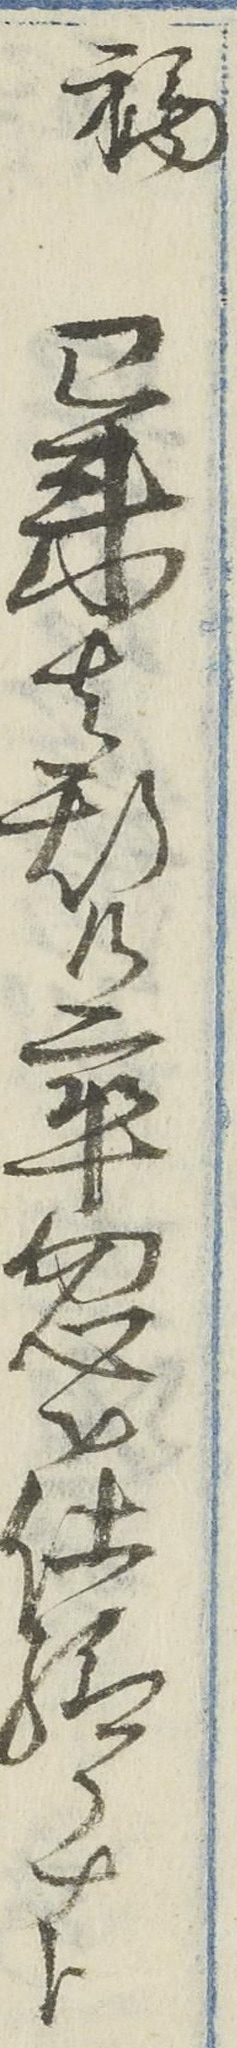福已来は斯ル卒惣ヲ仕給うナト
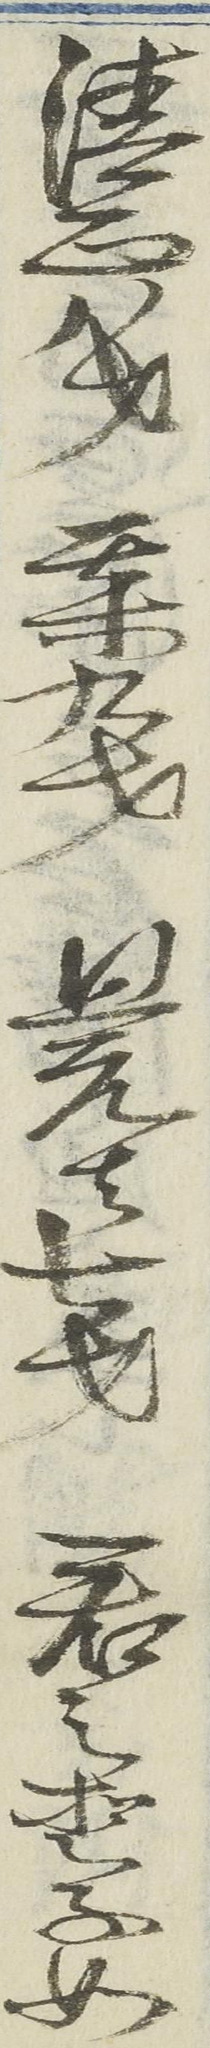清正八才某九才旦元は七才君之登子如
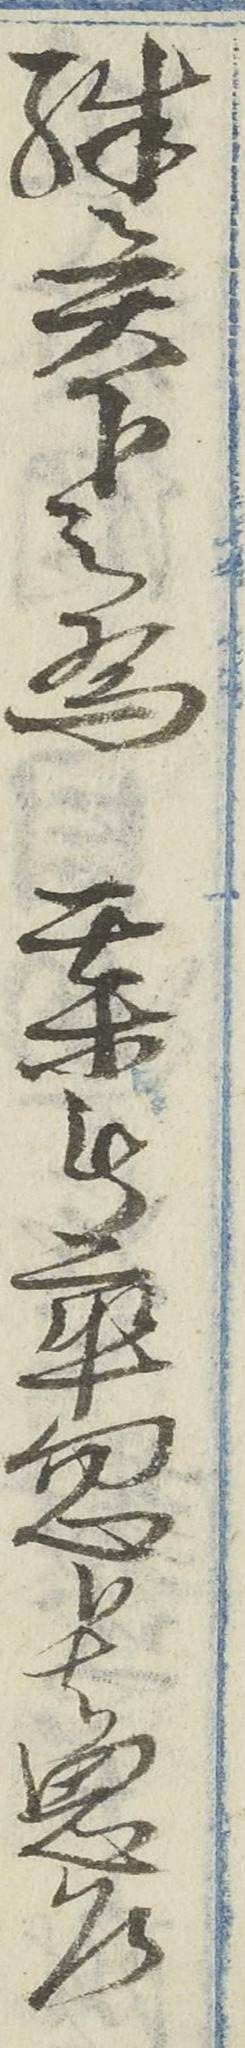殊ニ天下之為某も卒惣トは思乍
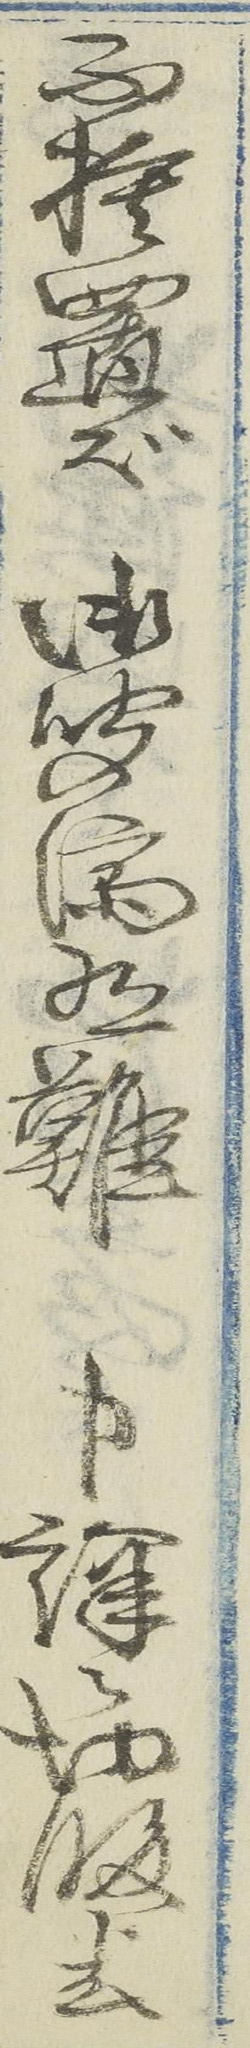不捨置ズ御聞済有難申譯ニ切腹ト云

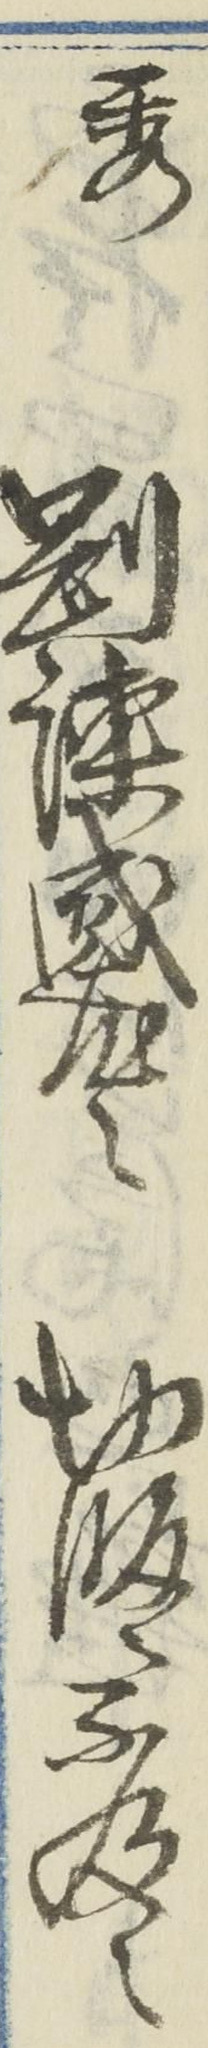秀別諌感心之切腹ニ不及之
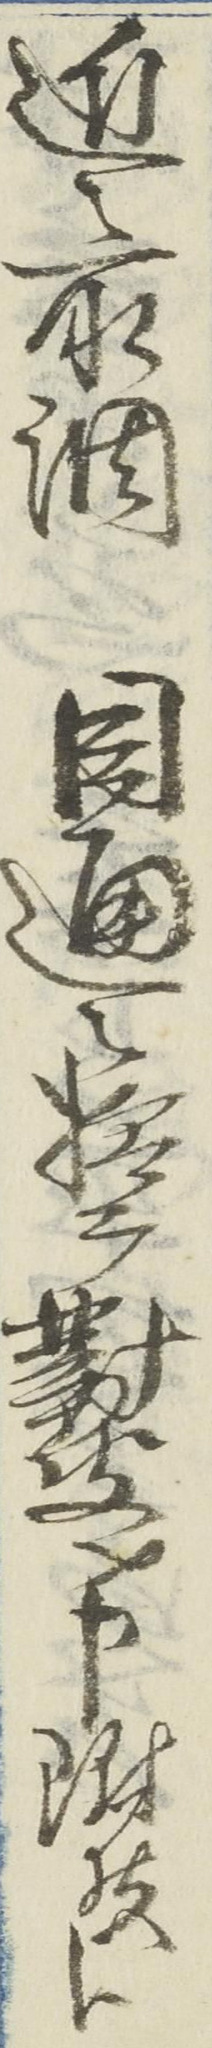近〻取調目通之揚テ対決ヲ申附候ト
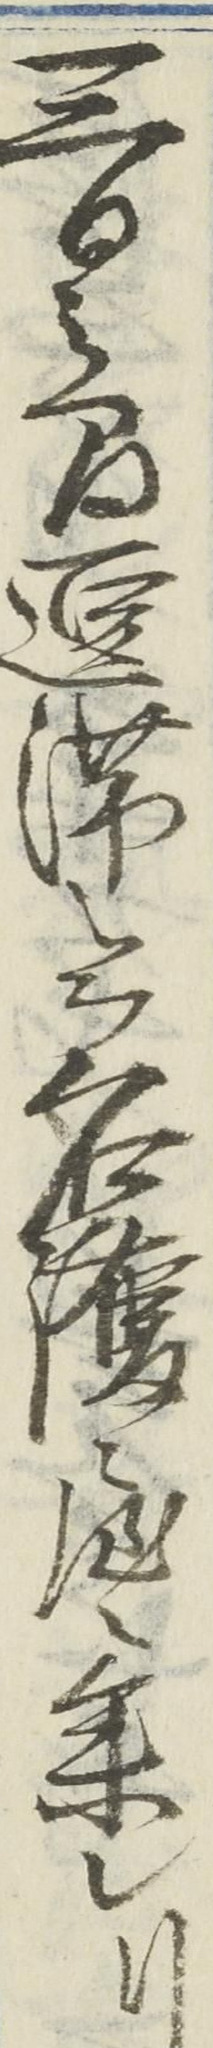三日之間逗滞シテ名護屋ニ参レリ
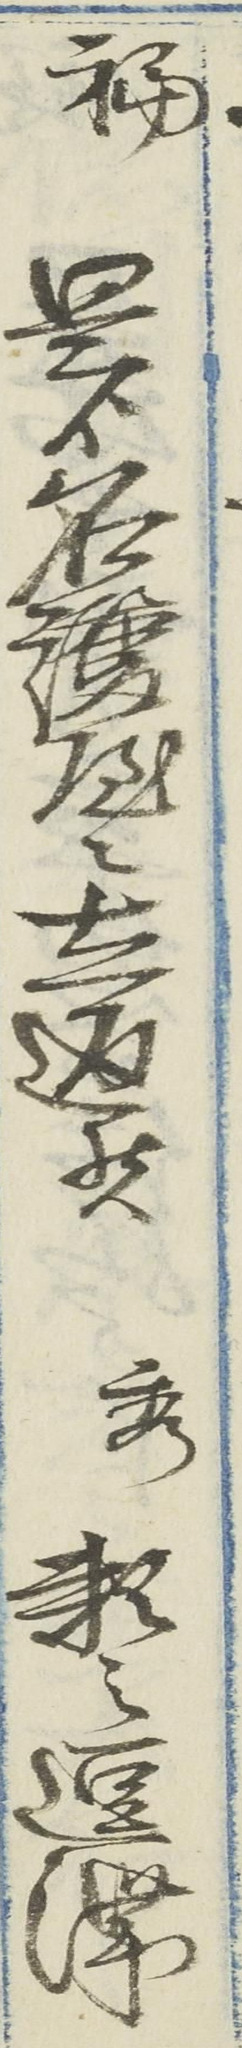福是ゟ名護屋ニ立返候秀頼ミ逗滞
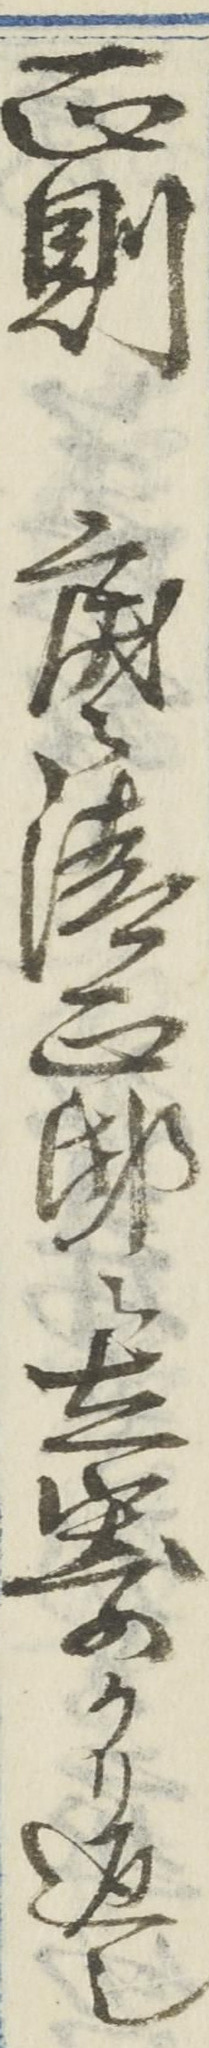正則戻ニ清正邸ニ立寄クリ返シ
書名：伏水大地震
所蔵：東京大学地震研究所図書室 Earthquake Research Institute Library, The University of Tokyo, JAPAN
